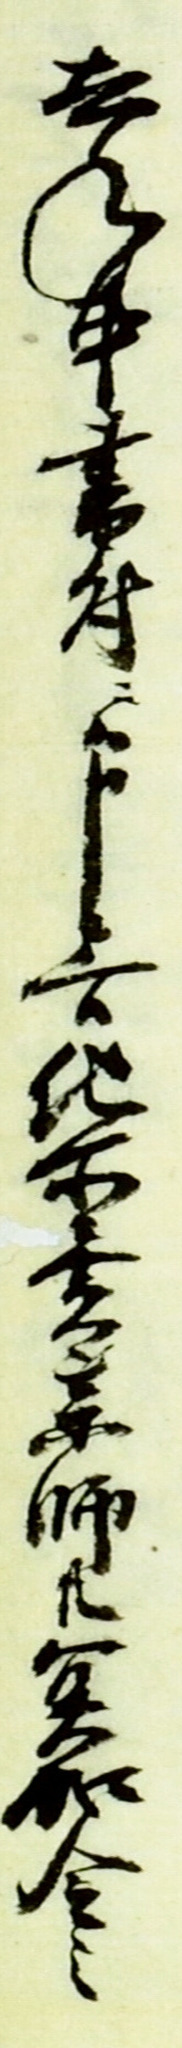去年中書付ニ而申上候他所売薬師共冥加金之
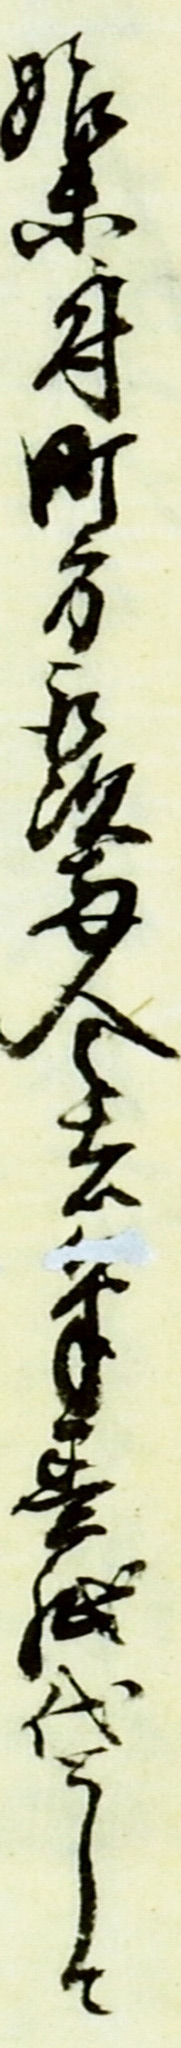始末ニ付町方取次両人之者筆墨紙代として
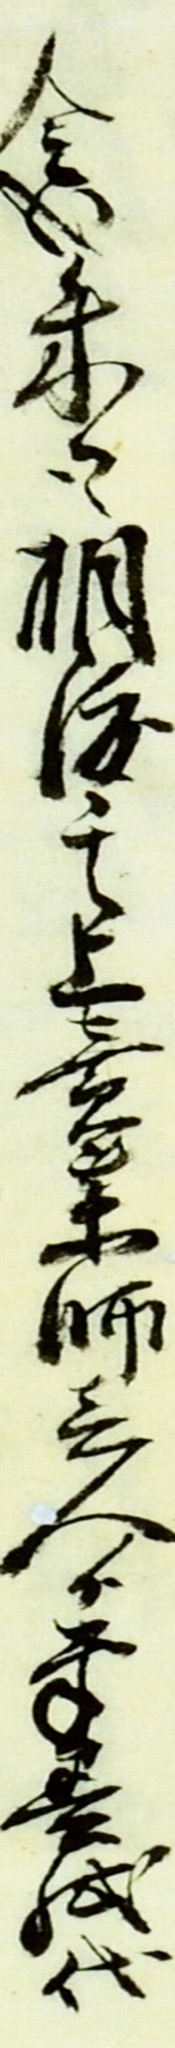金弐朱ツヽ相渡其上売薬師壱人ゟ筆墨紙代
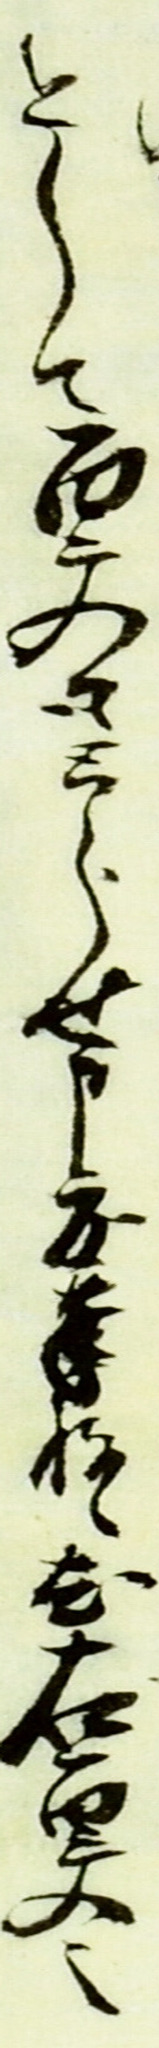として百文ツヽとらせ申度奉存候尤右百文之
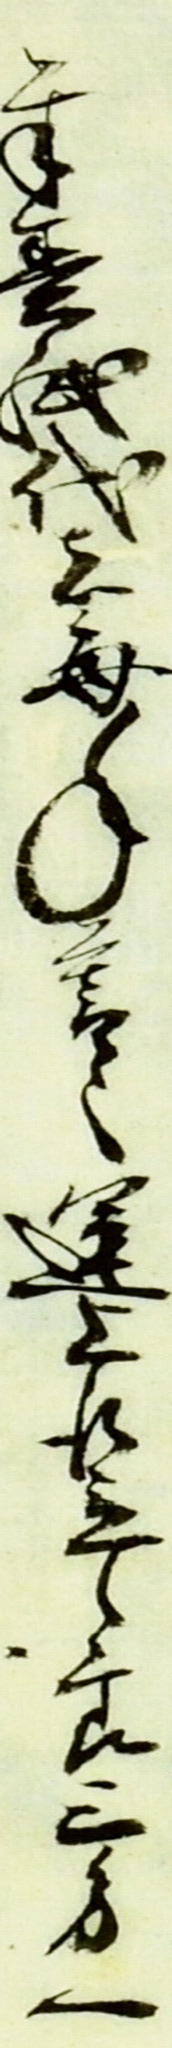筆墨紙代者毎年暮之運上取立之節三方一
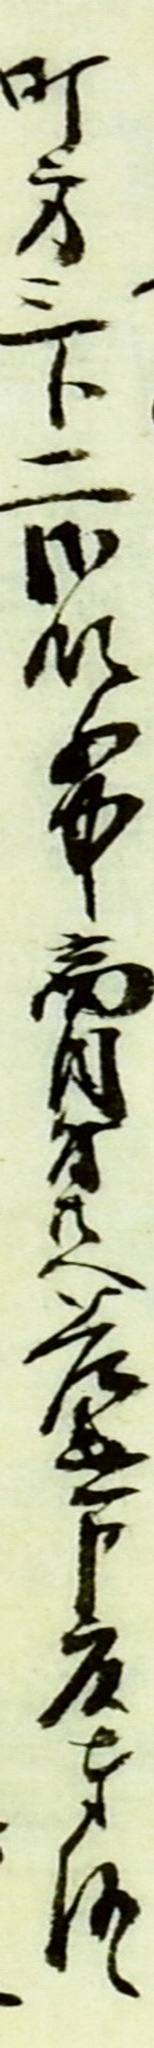町方三分二代領分中当月付共へ差遣申度奉存候
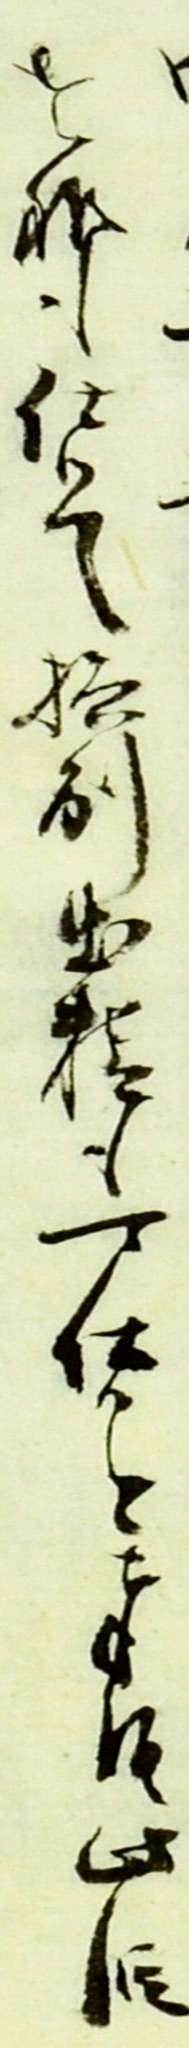左様も仕候はゝ格別出精も可仕候と奉存候此段
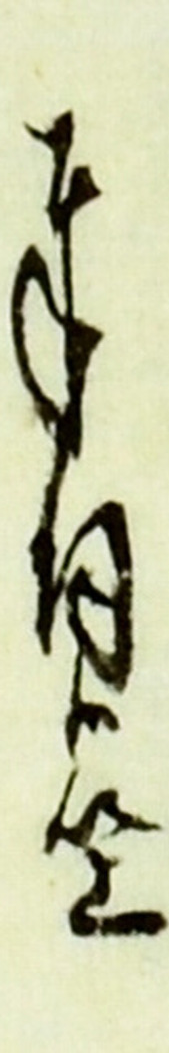奉伺候以上
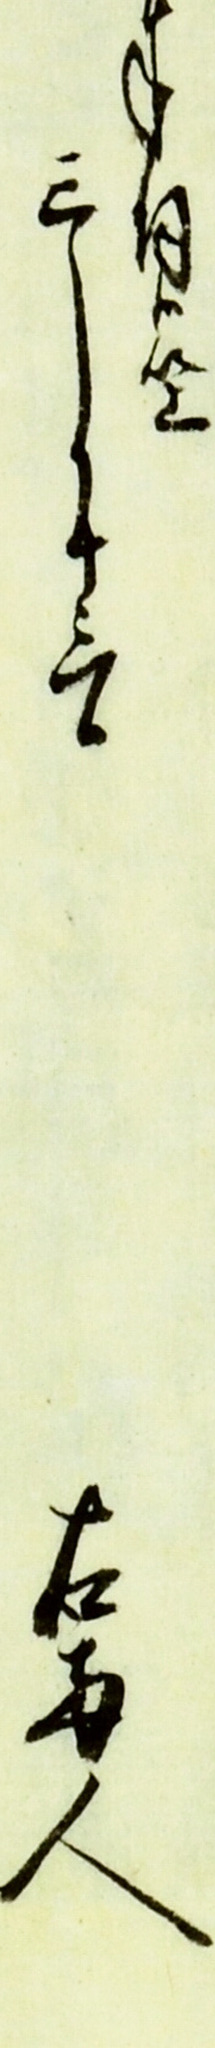三月十三日右両人
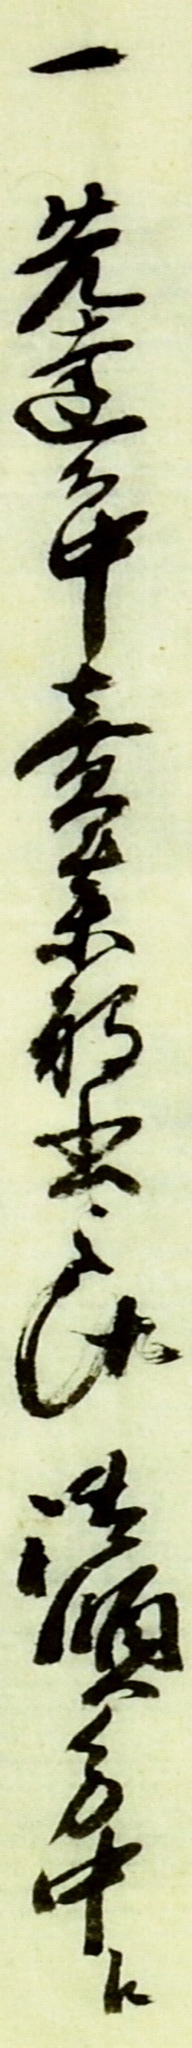一先達而中売薬触書之趣御領分中江
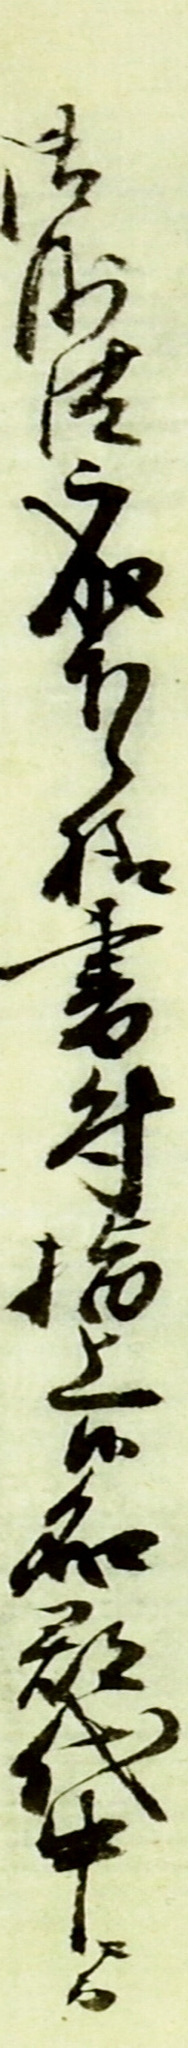御沙汰被成下候様書付指上候処郡代中ニ而
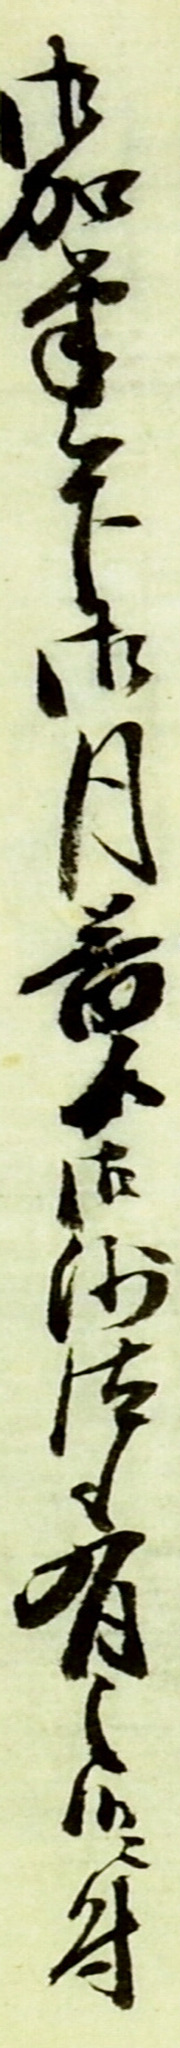御加筆被下御月番ゟ御沙汰も有之候ニ付
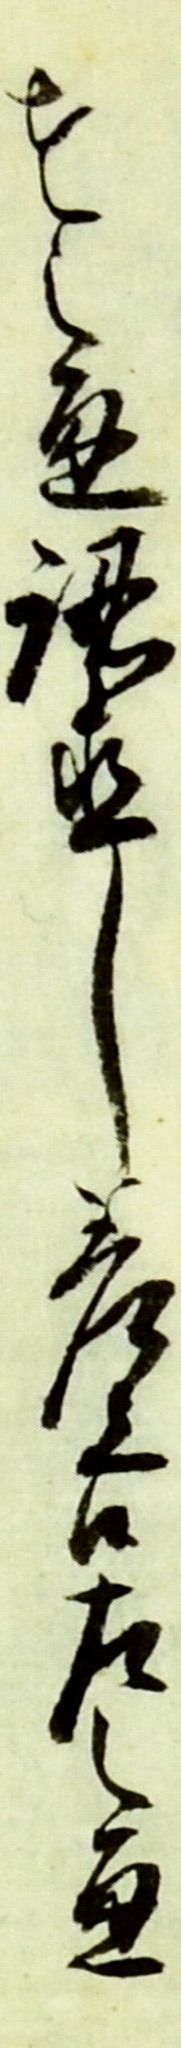左之通認直し差上候左之通
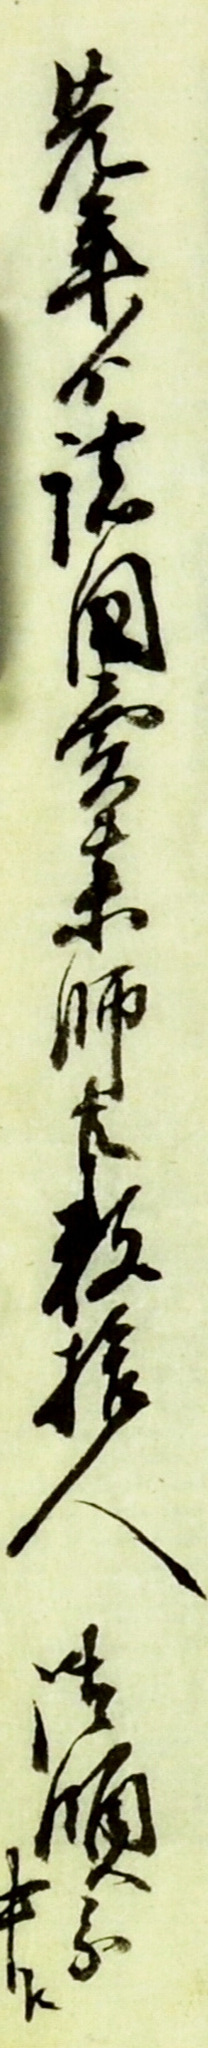先年ゟ諸国売薬師共数拾人御領分中江

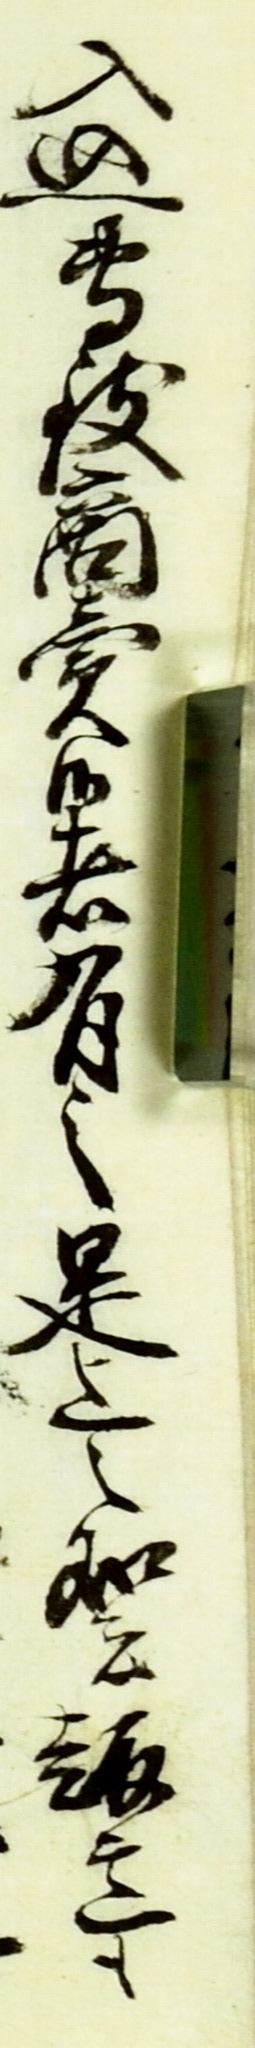入込専致商売候者有之是迄之処者趣意も
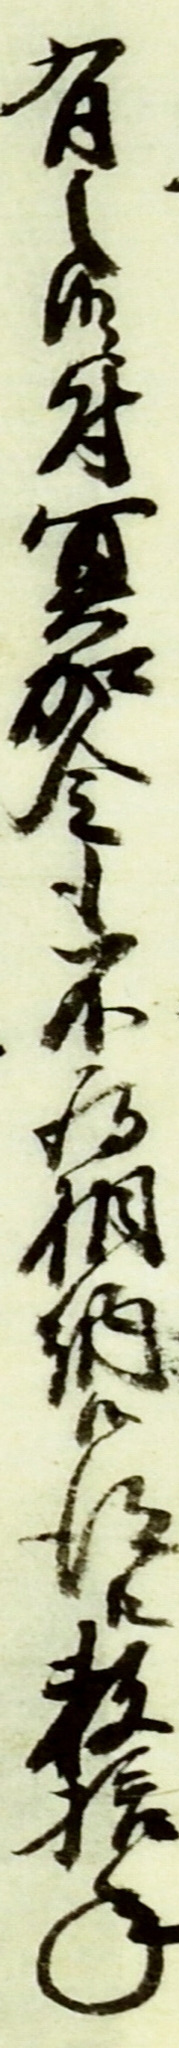有之候ニ付冥加金も不為相納候得共数拾年
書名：他国賣薬師運上之事
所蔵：伊那市立高遠町図書館・合同会社AMANE
